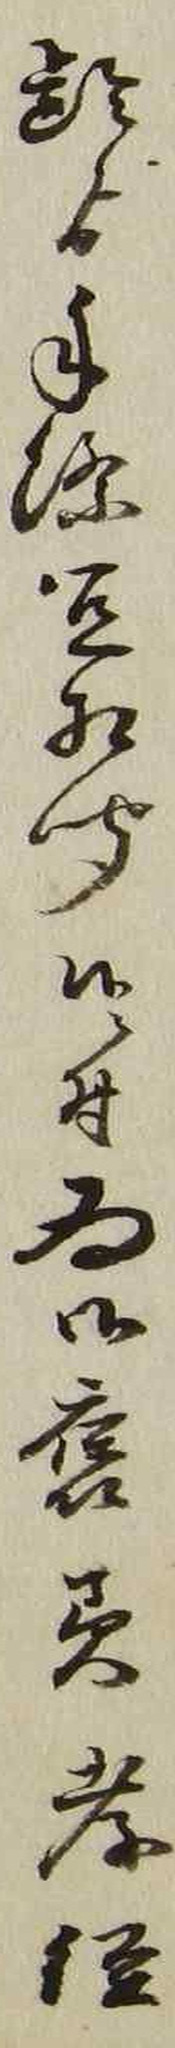齢ゟ手際宜相聞候ニ付為御褒美孝経
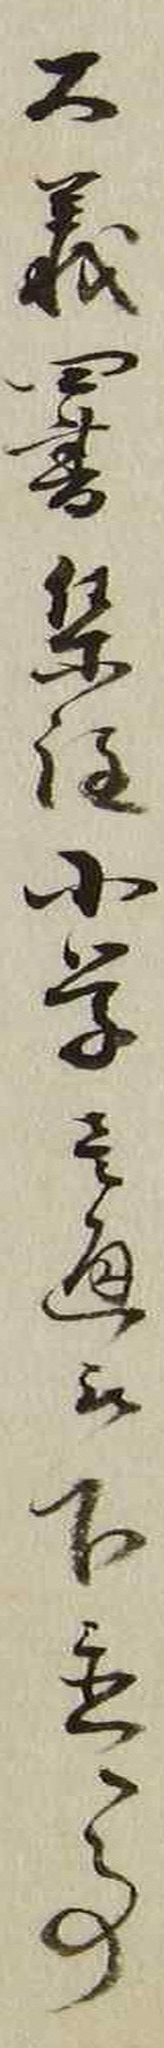大義四書集注小学壱通被下置候事
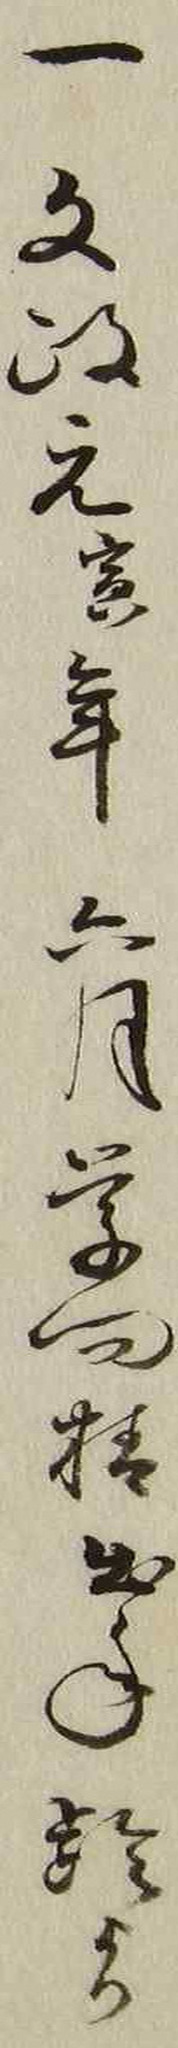一文政元寅年六月学問精出年齢より
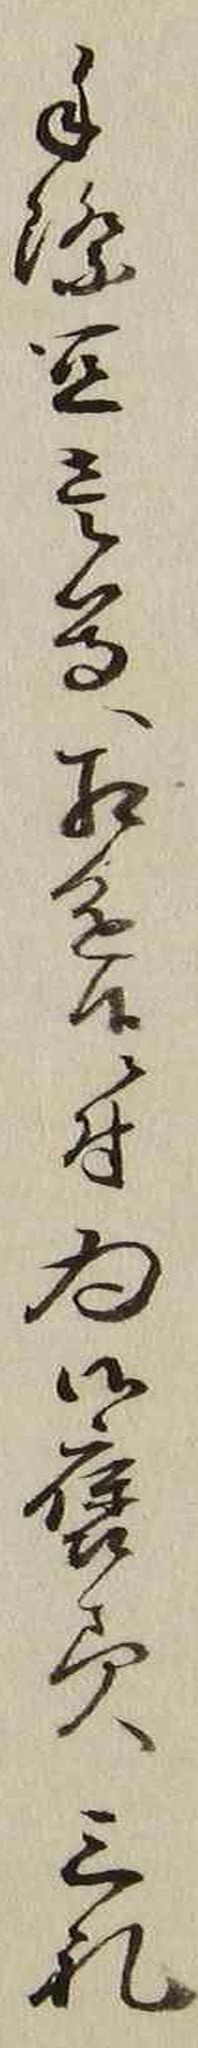手際宜壱等へ相進候ニ付為御褒美三礼
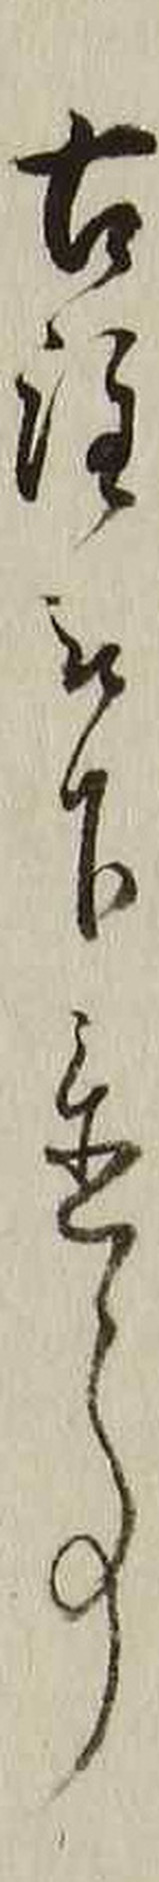古注被下置候事
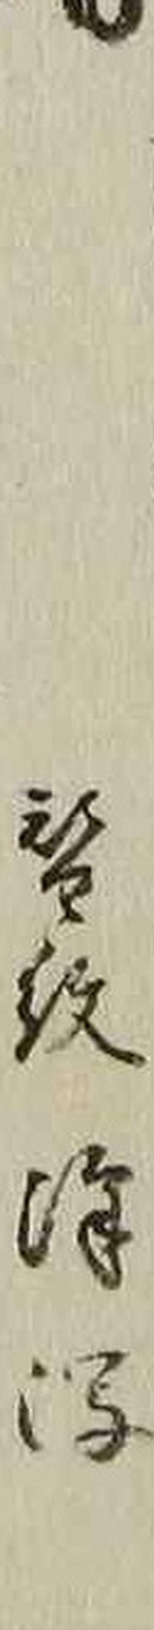替紋沢瀉
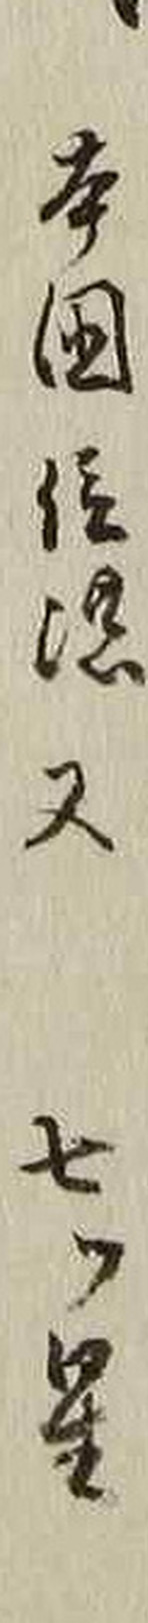本国信濃又七ツ星
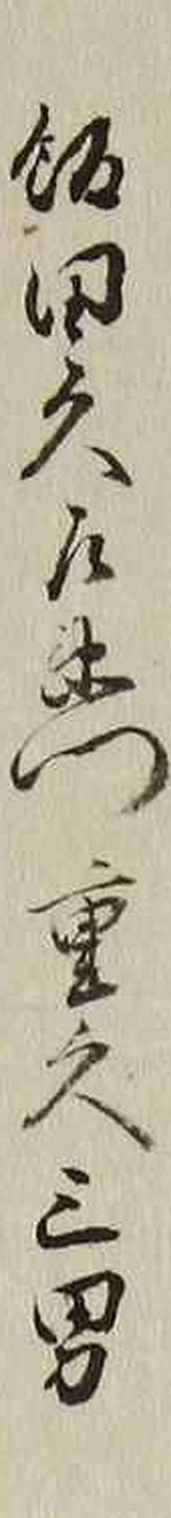飯田久左衛門重久三男
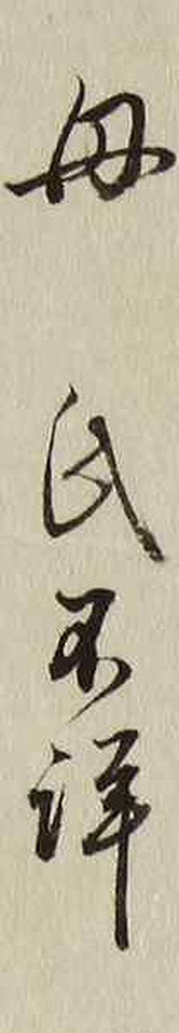母氏不詳
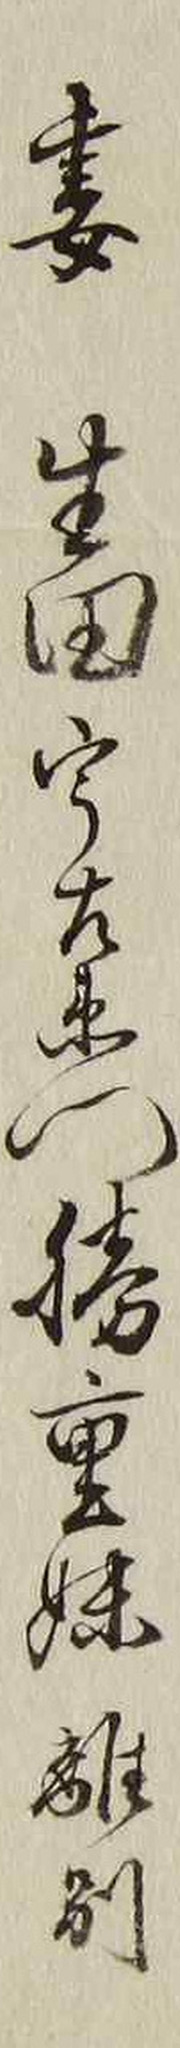妻生田宇左衛門勝重妹離別
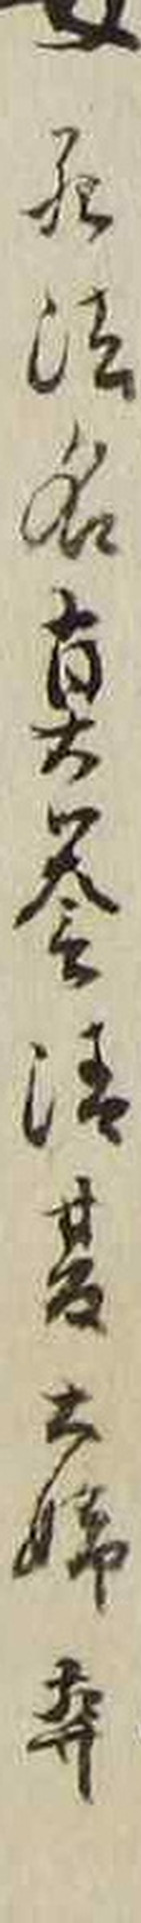死法名真誉清夏大姉葬
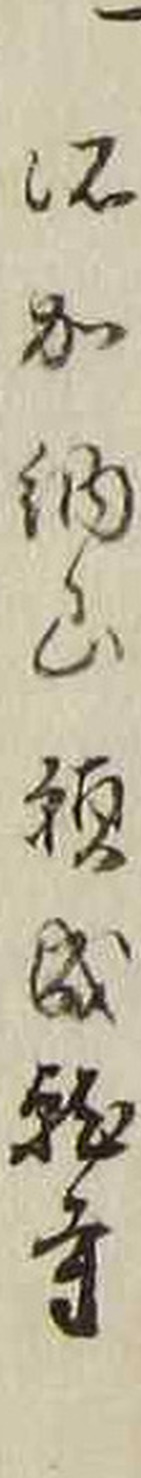所加納山願成就寺

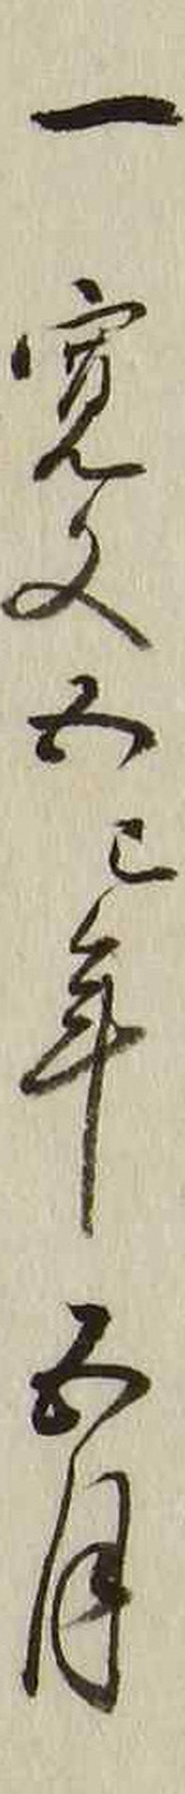一寛文五巳年五月
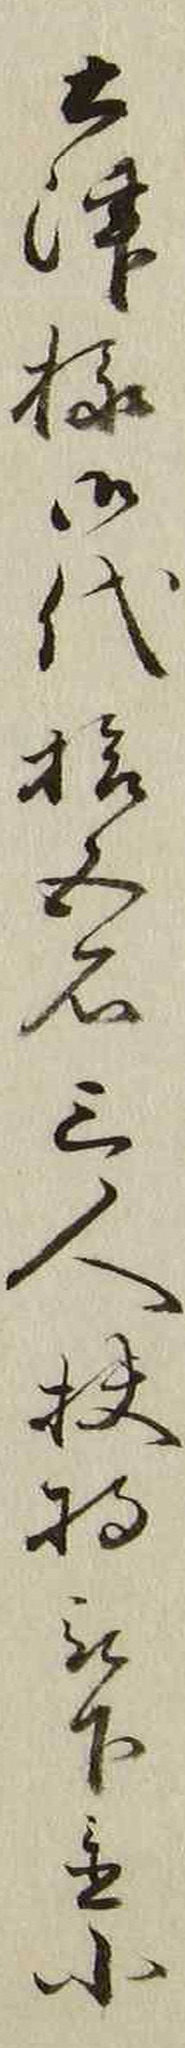土津様御代拾五石三人扶持被下置小
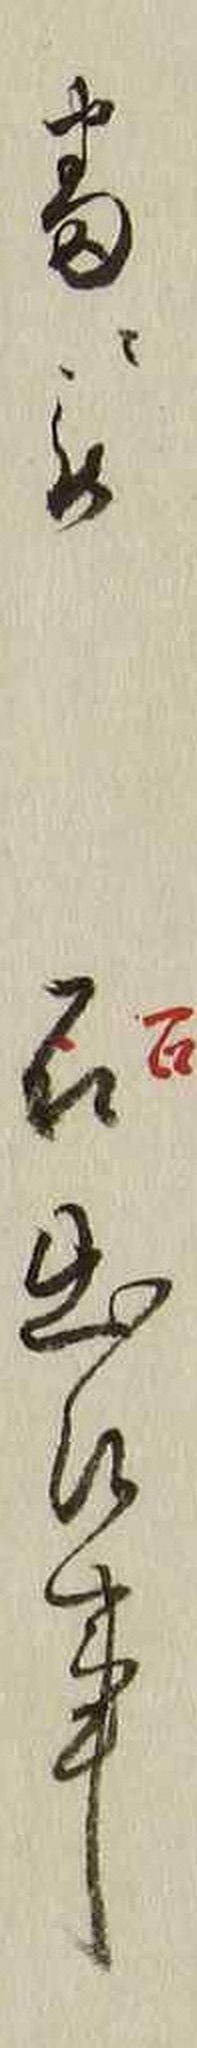番ニ被召出候事
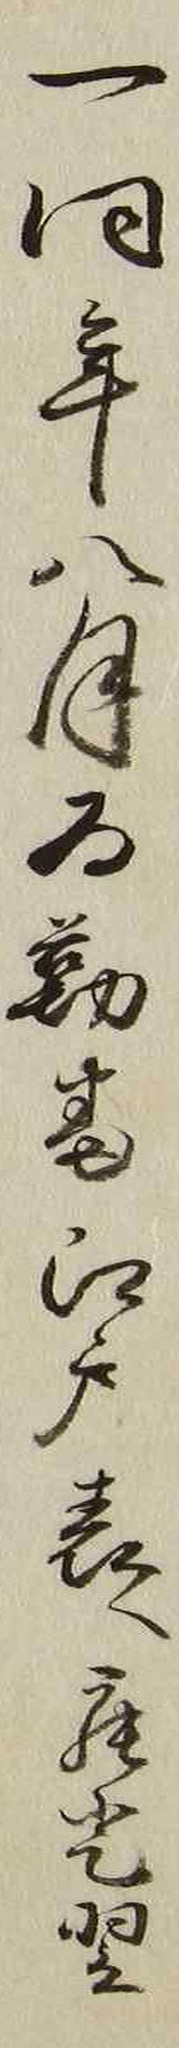一同年八月為勤番江戸表へ罷登翌
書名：諸士系譜　巻之4　い之部4
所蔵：会津若松市立会津図書館
